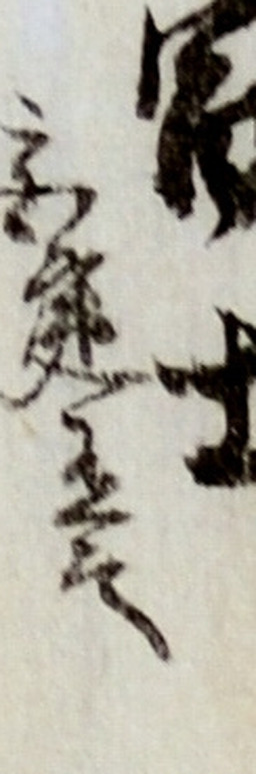宮建有之
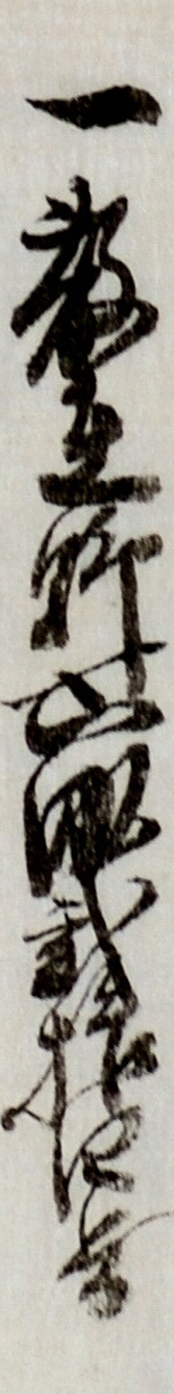一散在野六畝弐拾四歩
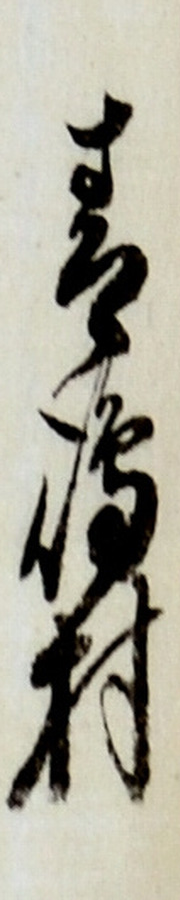青島村
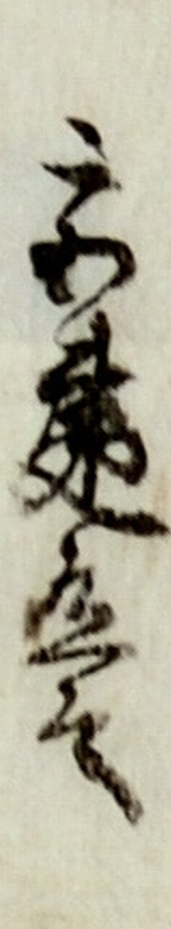宮建有之

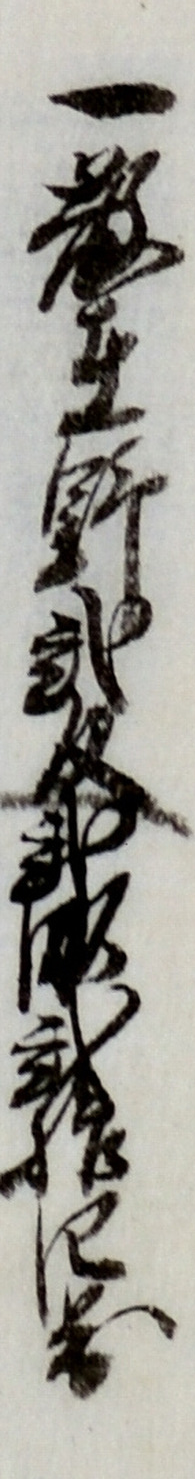一散在野弐反弐畝弐拾四歩
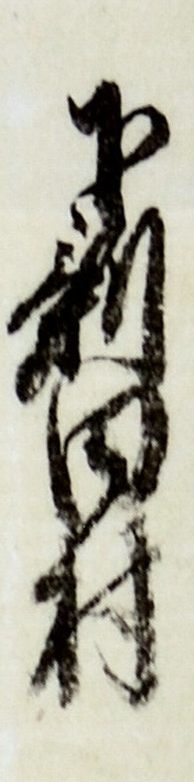下新田村
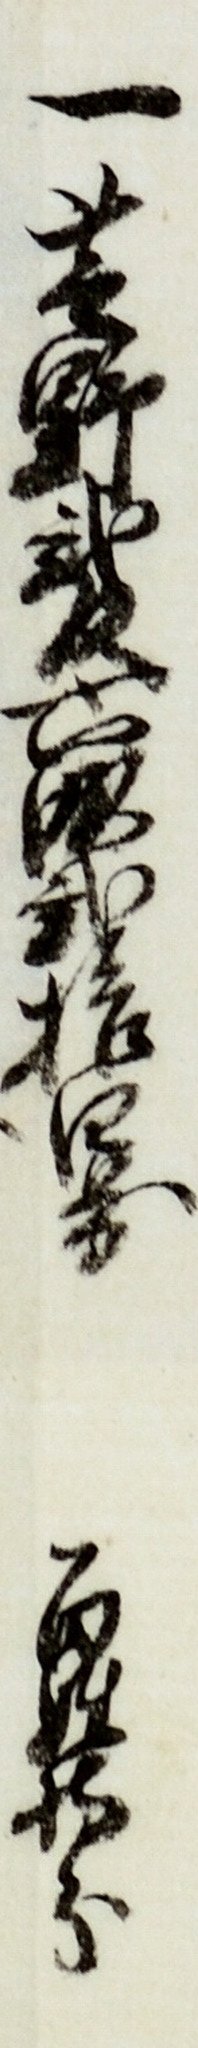一芝野弐反六畝弐拾四歩百姓持分
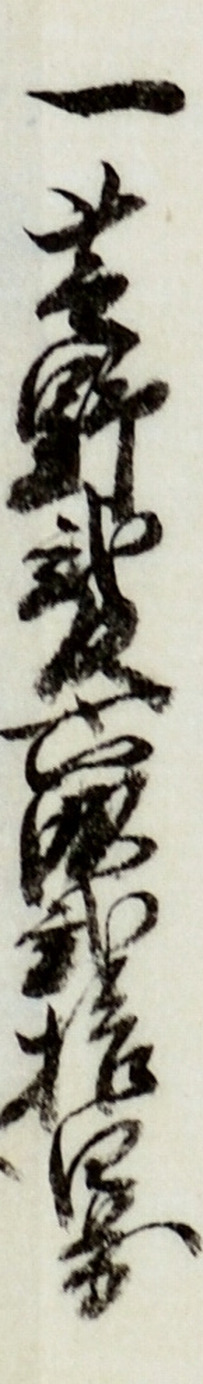一散在野弐反弐畝弐拾四歩
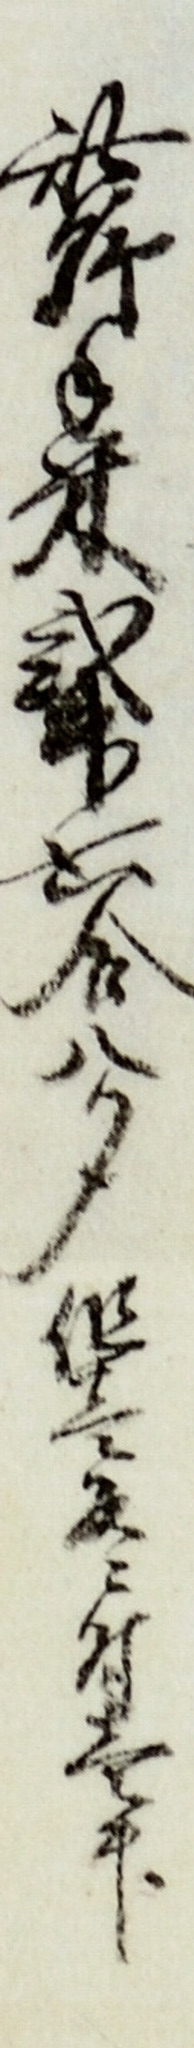此野手米弐升六合八勺但壱反ニ付壱升
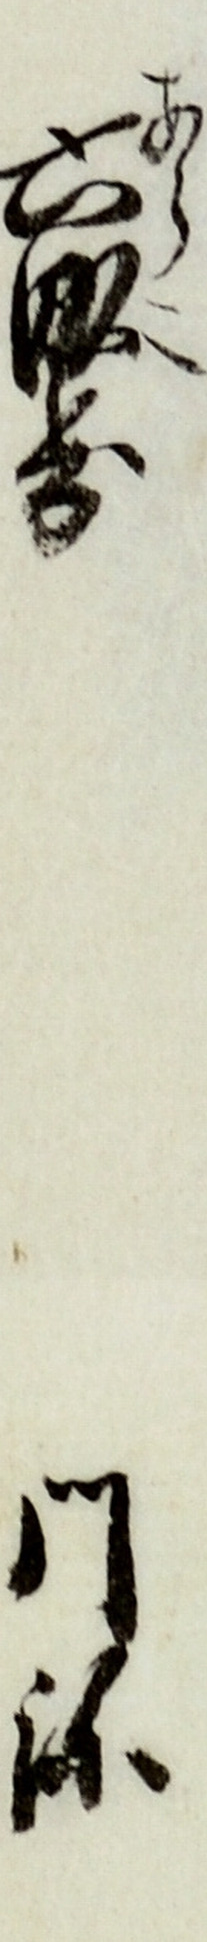六畝歩門弥
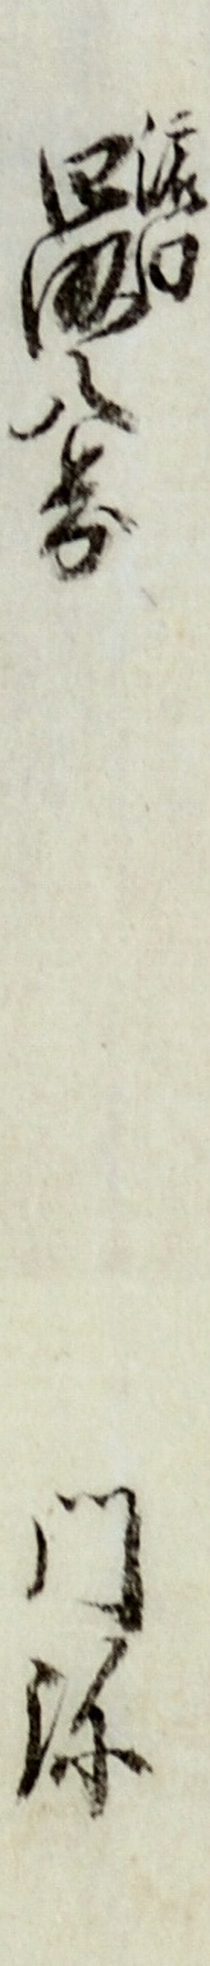四畝八歩門弥
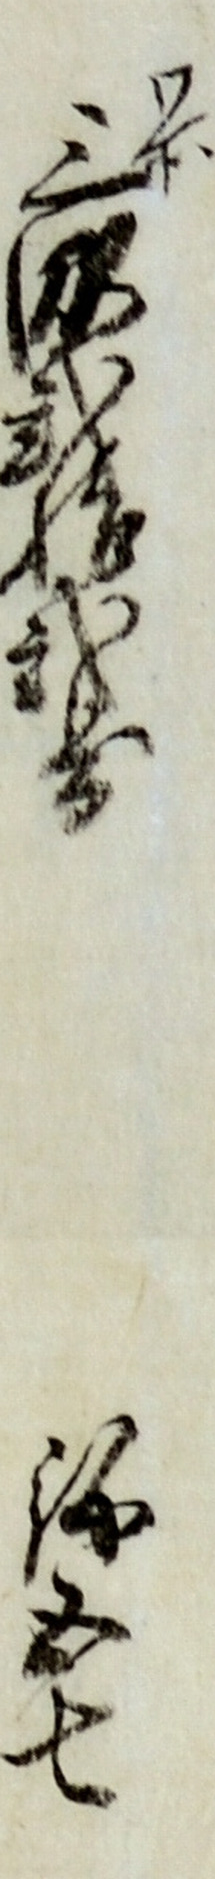三畝弐拾弐歩弥五七

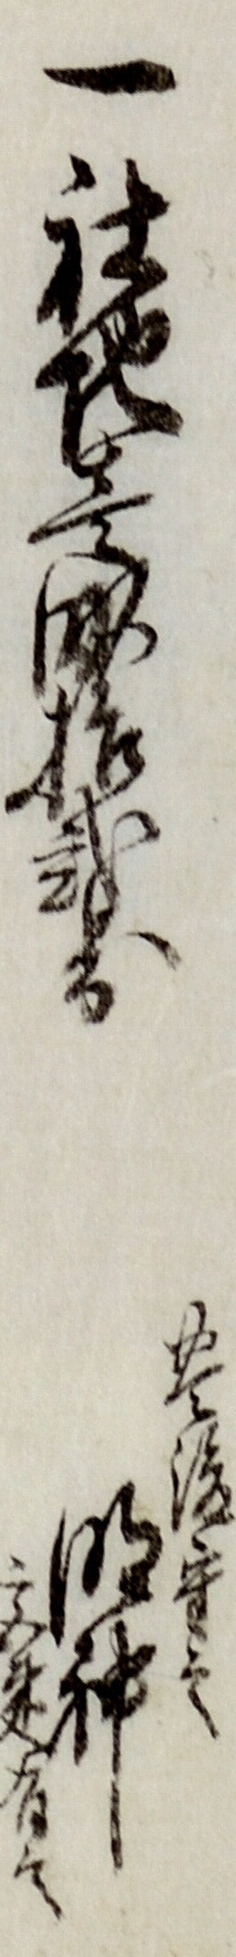一社地壱畝拾弐歩明神
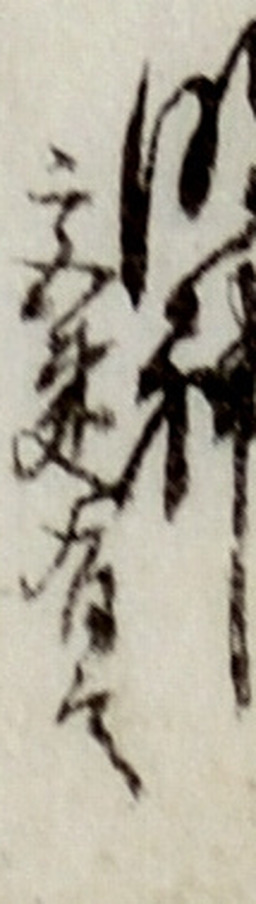宮建有之
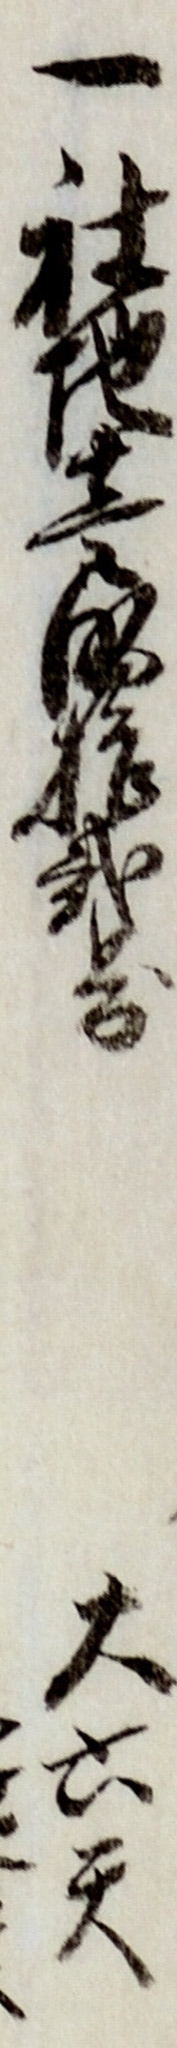一社地壱畝拾弐歩大六天
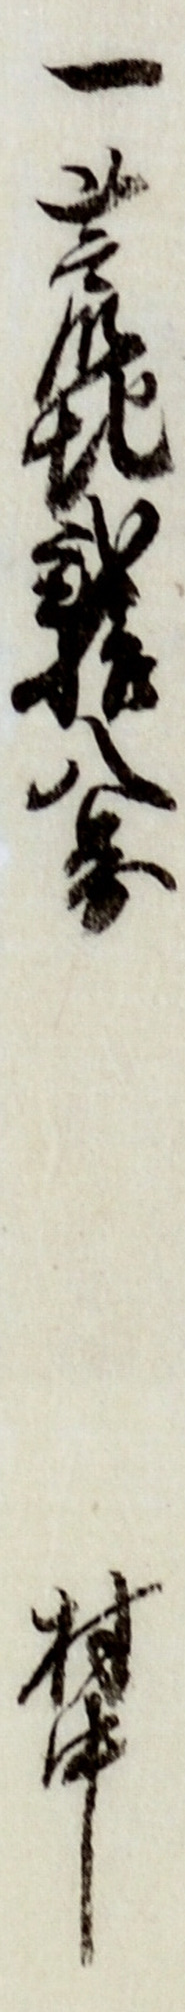一荒地弐拾八歩村中
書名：御領分中山林社地手控
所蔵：伊那市立高遠町図書館・合同会社AMANE
